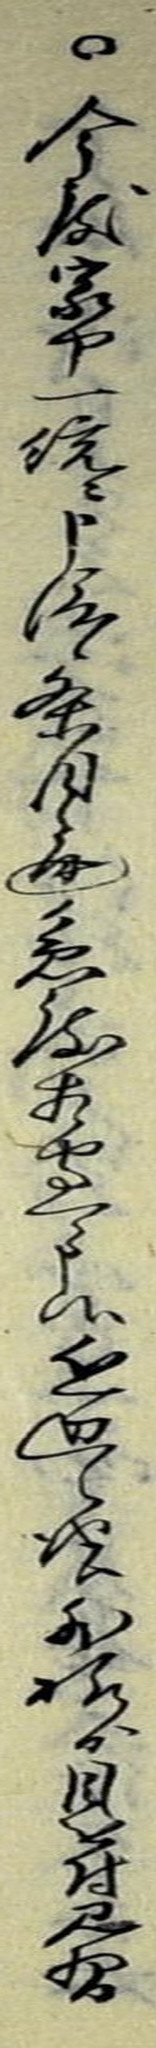〇今度家中一統ニ申渡候条目之通急度相守可申候近辺之儀ハ外様ゟ目を付見習
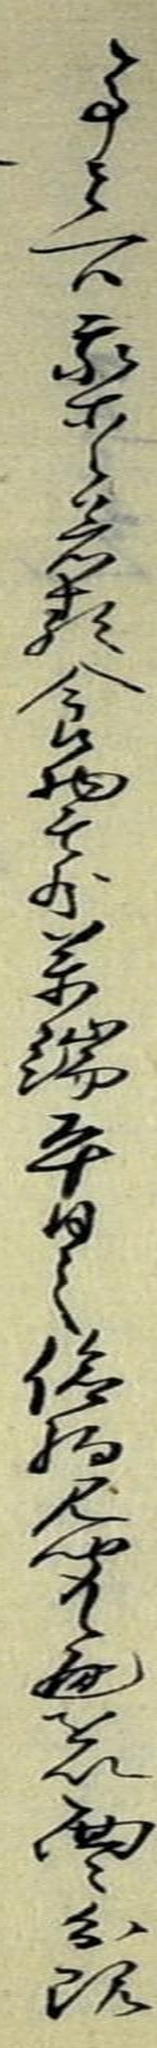候事ニ候ヘハ我等之着類食物其外万端平日之倹約見聞之通を以面々分限
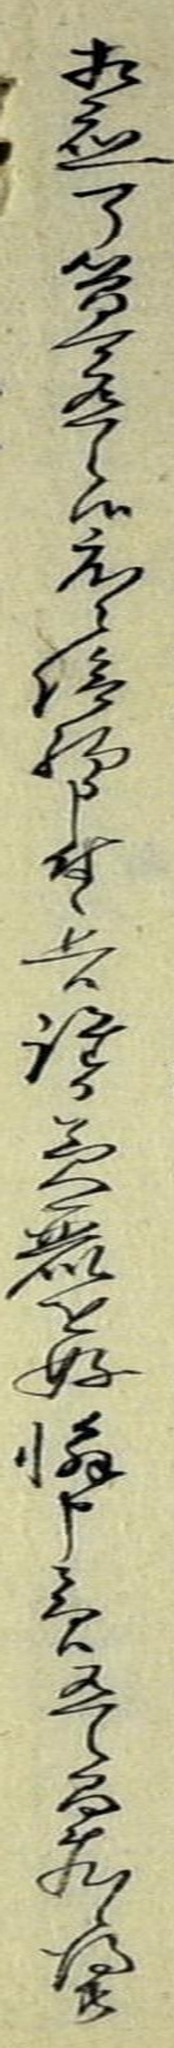相応了簡可有之候度々倹約申付候上ハ誰か美麗を好懈申ニ而ハ有之間敷候得共
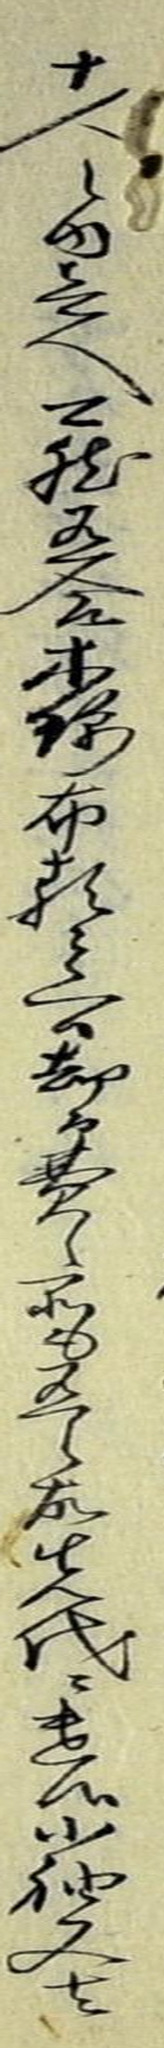十人之内壱人可然有合木綿布類ニ候ヘハ却而費候品も有之故先代ニ遣候小袖又者
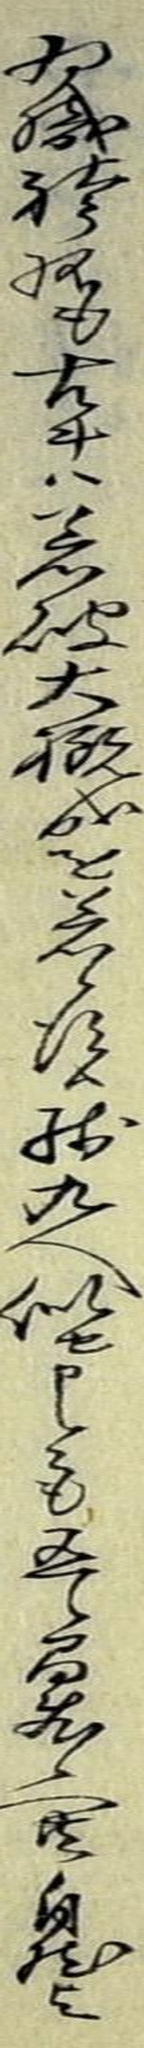羽織袴抔も古キハ着破大概成を着候得ハ残九人似セ申候ニも有之間敷候へ共自然与
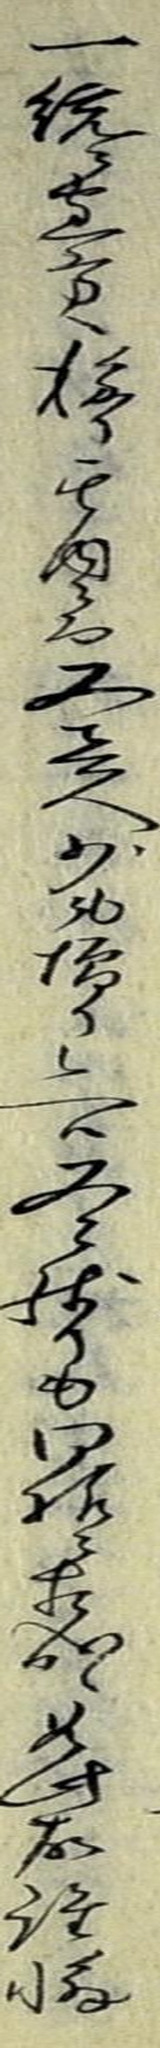一統ニ宜方へ移り其内ニ而又壱人少も増り候ヘハ又々残りも同様ニ相成候如此故誰懈
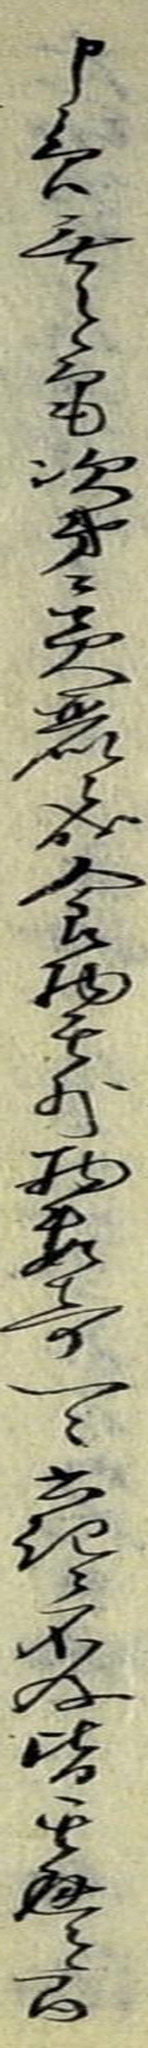申ニ而ハ無之候而も次第美麗被成食物其外物数奇一々書記ニ不及皆其通ニ候間
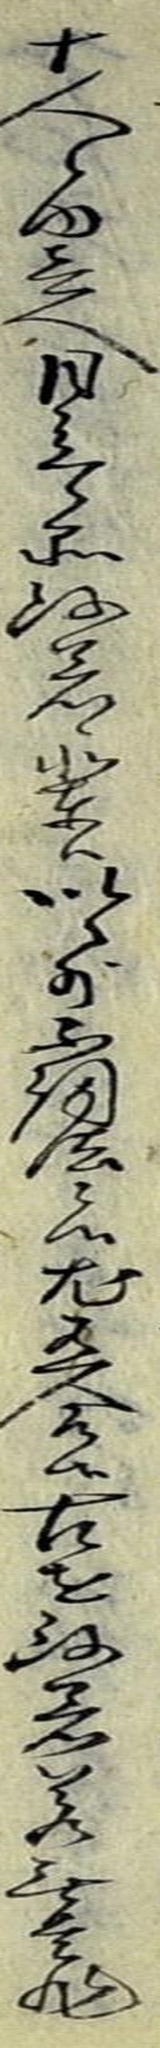十人之内壱人目立候品致着候輩ハ以之外不調法ニ候尤有合候古を致着若無是非
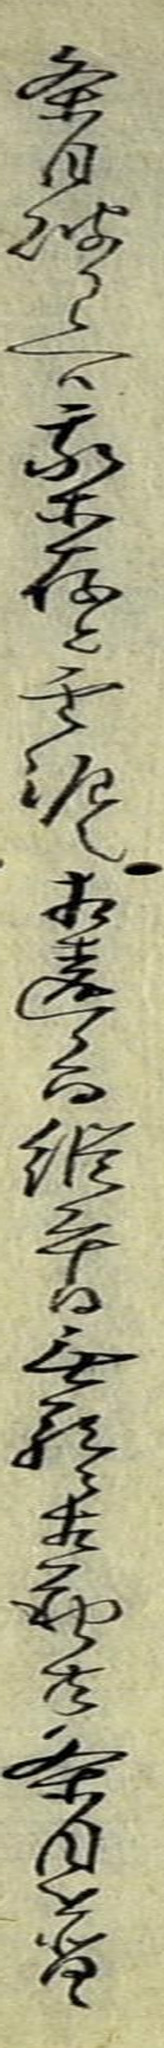条目破り候ヘハ我等存と雲泥之相違候間縦平日無難ニ相勤候共条目を背候
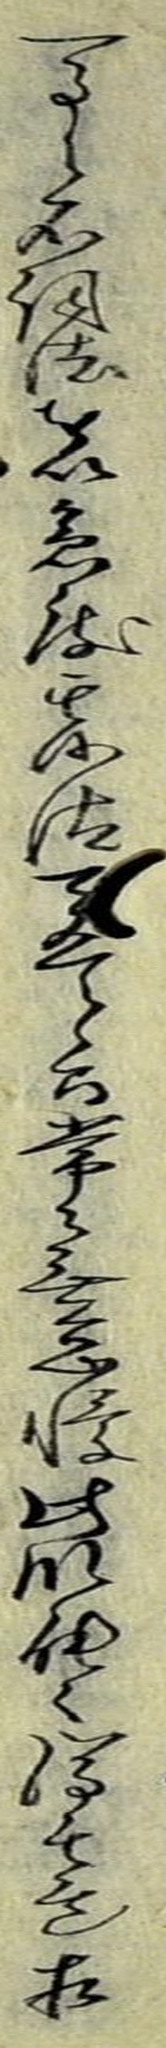一事之不調法を以急度其沙汰可有之候間常ニ無怠慢此段能々得其意相
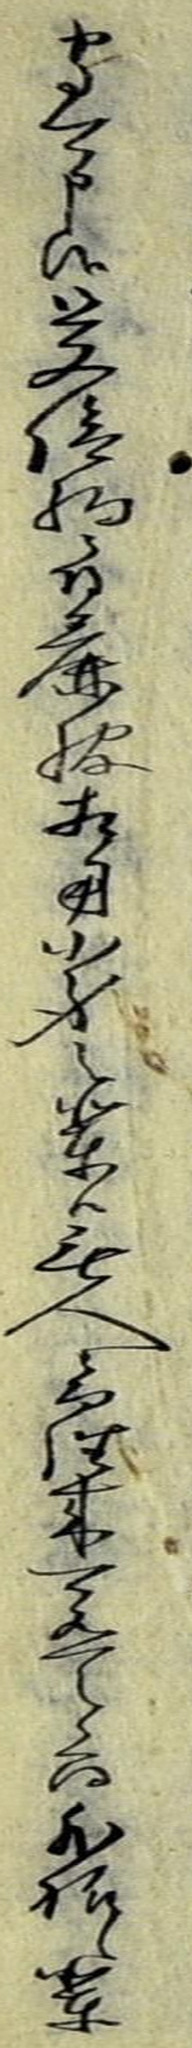守可申候且又倹約ニ付麁服相用小身之輩ハ無人ニ而往来可有之候間外様之輩

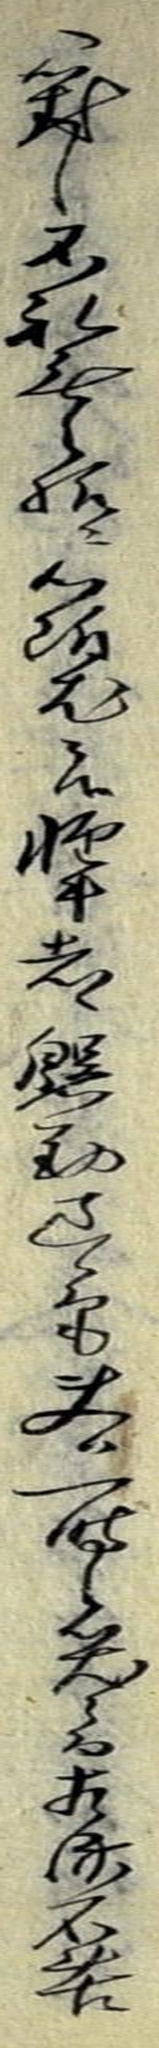へ対し不礼無之様ニ心付尤ニ候軽キ者へ慇勤過候而も夫ハ一時之笑ニ而相済不苦
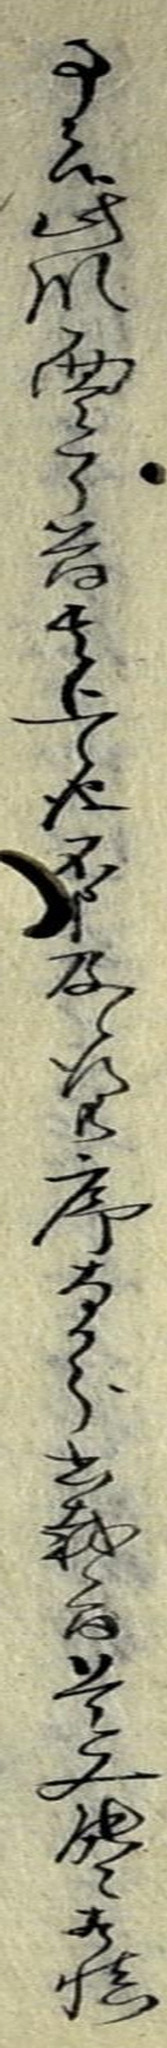事ニ候此段面々了簡其上之儀不申及候得共序なから書載候間是又能々相慎
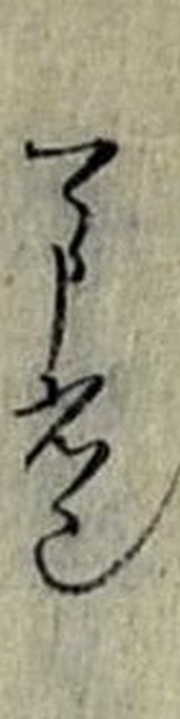可申者也
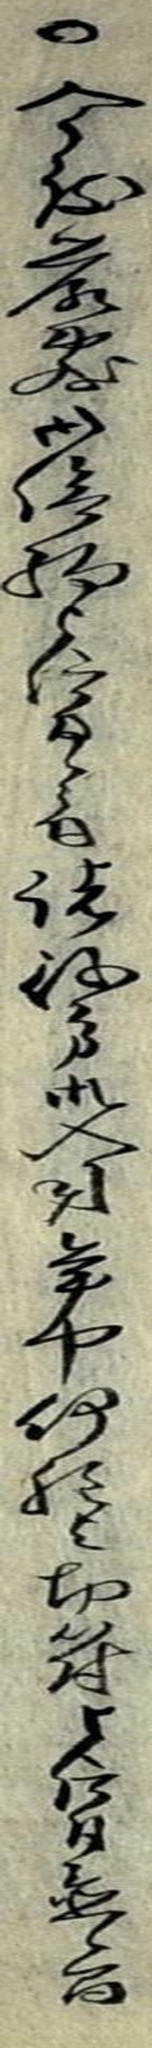〇今度厳敷御倹約被仰付候ニ付諸役方御入用年中何程与切符被仰付置候間
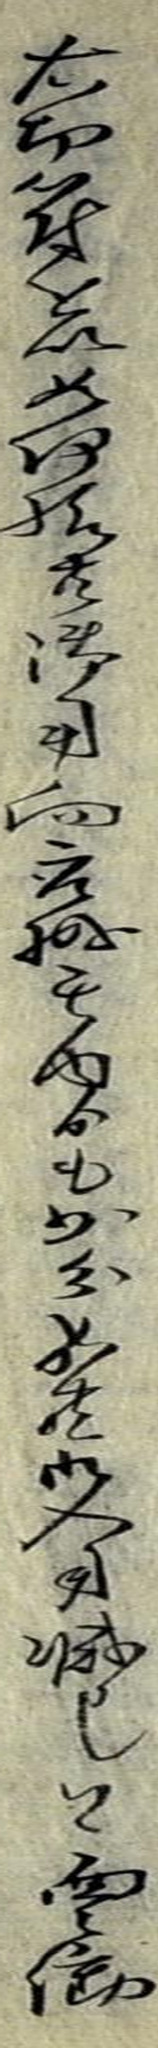右切符を以如何様共御用向取扱其内ゟも少分成共御入用減申候ハヽ面々働
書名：命令之部 一
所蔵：福井県文書館 Fukui Prefectural Archives
